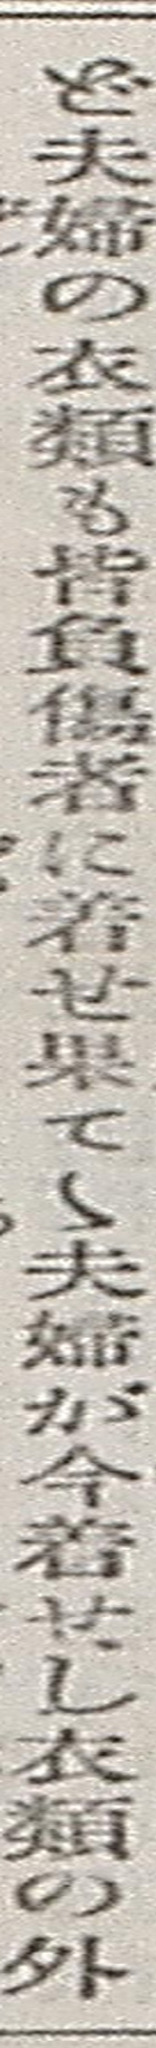ど夫婦の衣類も皆負傷者に着せ果てゝ夫婦が今着せし衣類の外
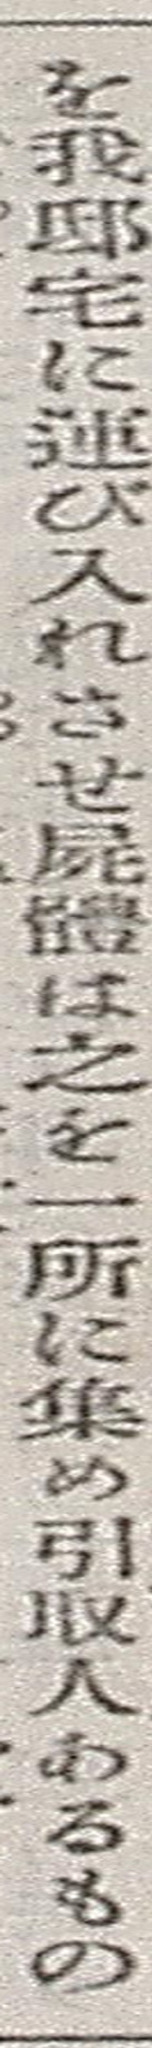を我邸宅に運び入れさせ屍体は之を一所に集め引取人あるもの
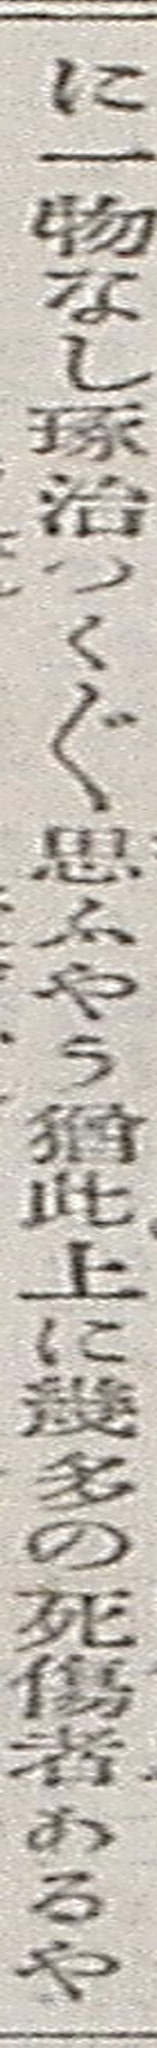に一物なし琢治つく〴〵思ふやう猶此上に幾多の死傷者あるや
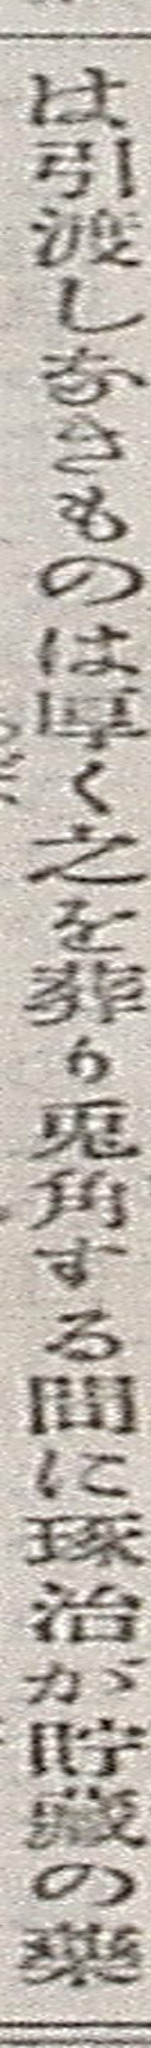は引渡しなきものは厚く之を葬り兎角する間に琢治が貯蔵の薬
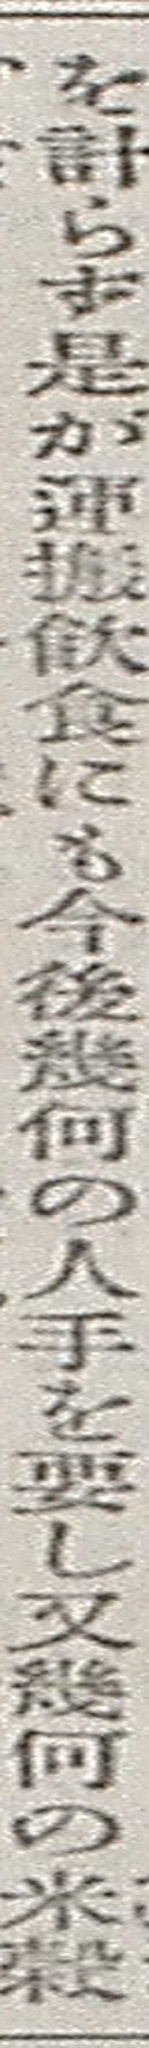を計らず是が運搬飲食にも今後幾何の人手を要し又幾何の米穀
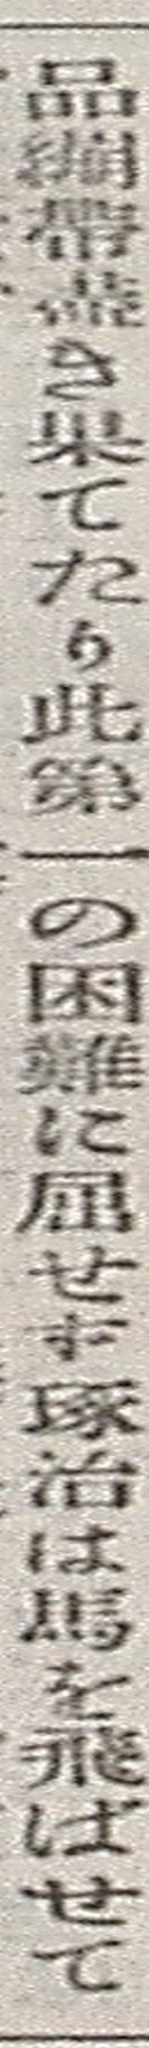品繃帯尽き果てたり此第一の困難に屈せず琢治は馬を飛ばせて
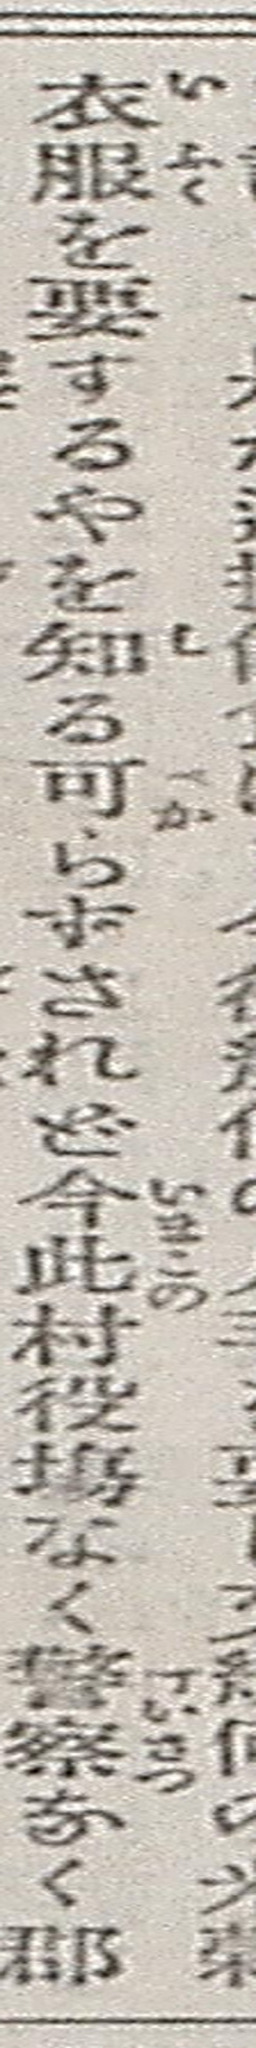衣類を要するやを知る可らずされど今此役場なく警察なく郡
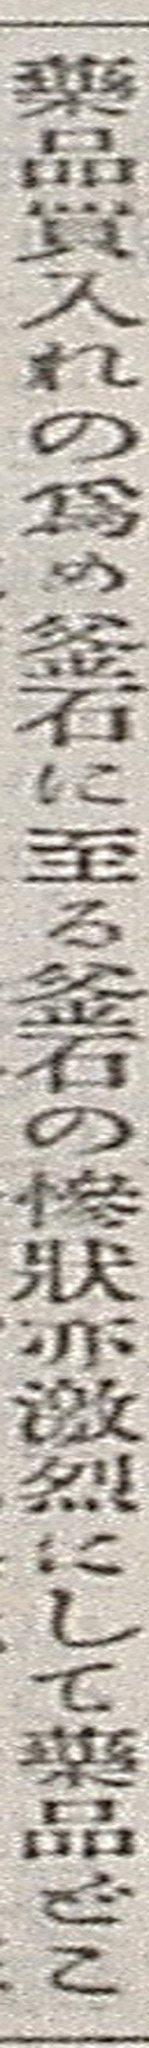薬品買入れの為め釜石に至る釜石の惨状亦激烈にして薬品どこ
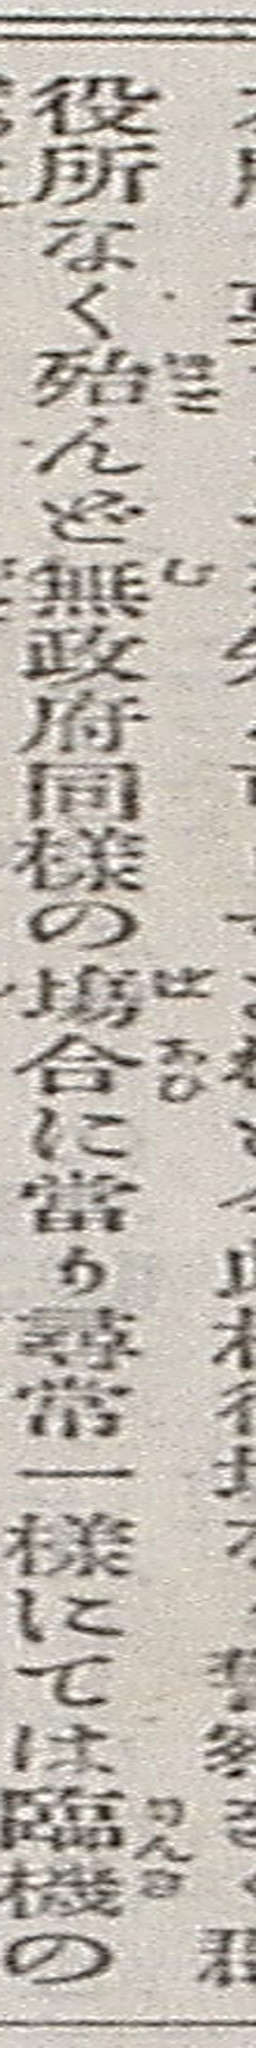役所なく殆んど無政府同様の場合に当り尋常一様にては臨機の
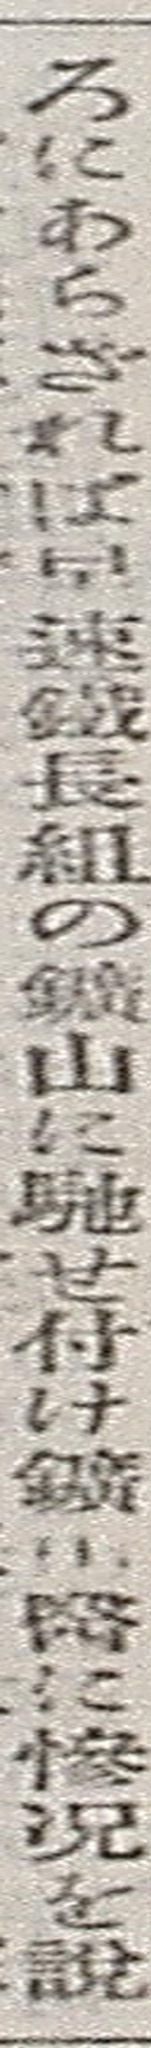ろにあらざれば早速鉄長組の鉱山に馳せ付け鉱山医に惨況を説
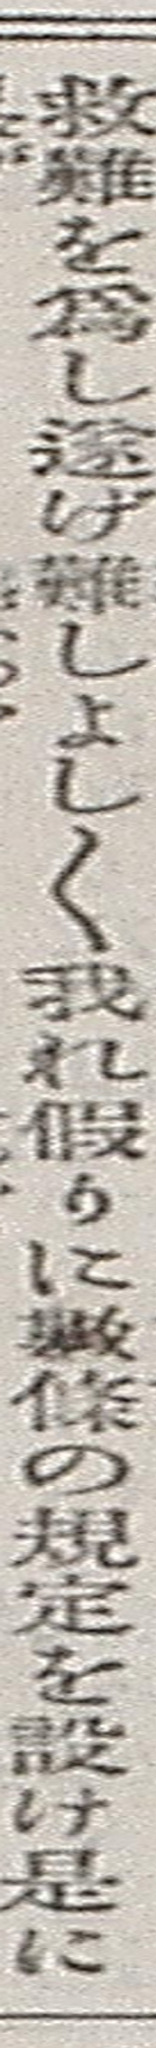救難を為し遂げ難くよし〳〵我れ仮に数条の規定を設け是に
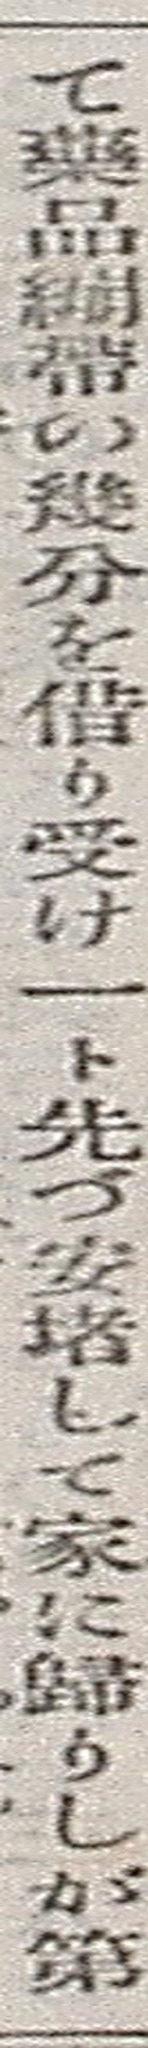て薬品繃帯の幾分を借り受け一ト先づ安堵して家に帰りしが第
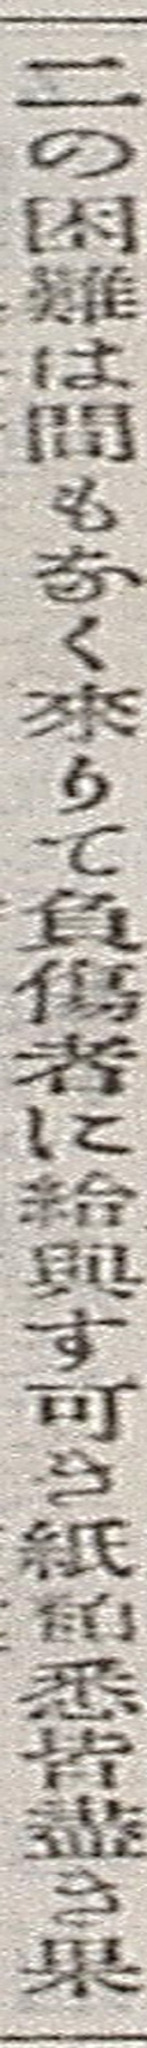二の困難は間もなく来りて負傷者に給与す可き紙類悉皆尽き果
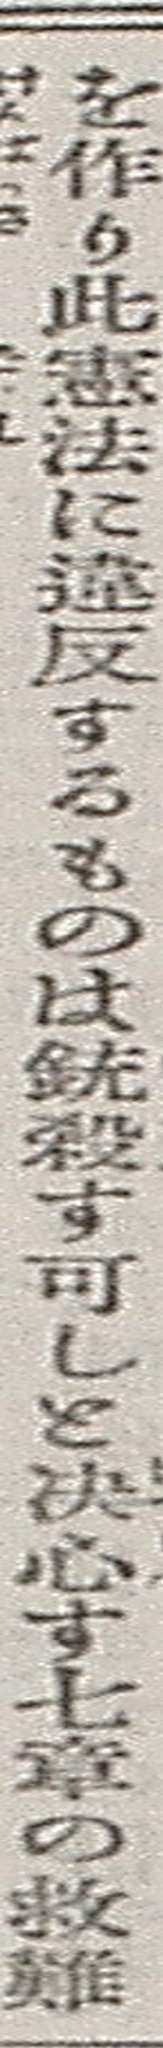を作り此憲法に違反するものは銃殺す可しと決心す七章の救難
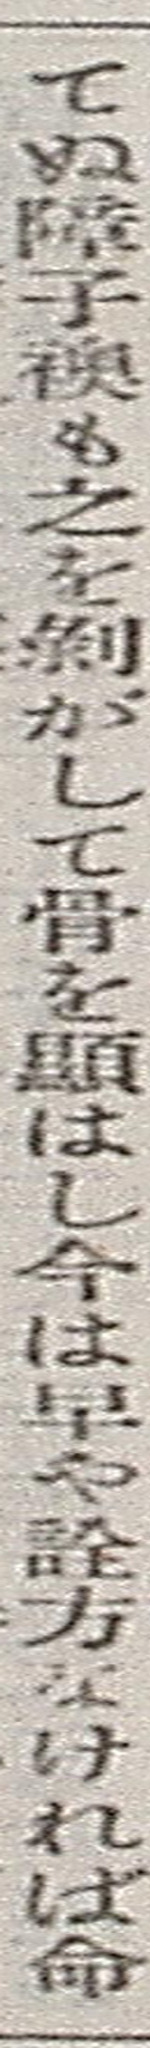てぬ障子襖も之を剥がして骨を顕はし今は早や詮方なければ命
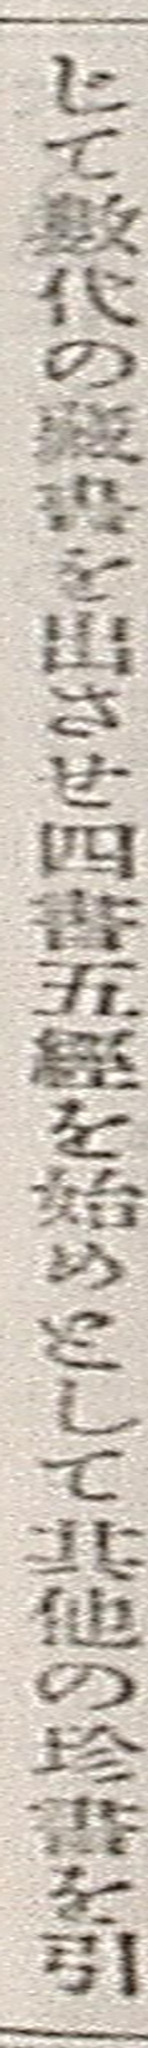じて数代の蔵書を出させ四書五経を始めとして其他の珍書を引
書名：風俗畫報臨時増刊第百二十號　大海嘯被害録（下）
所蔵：東京大学地震研究所図書室 Earthquake Research Institute Library, The University of Tokyo, JAPAN
